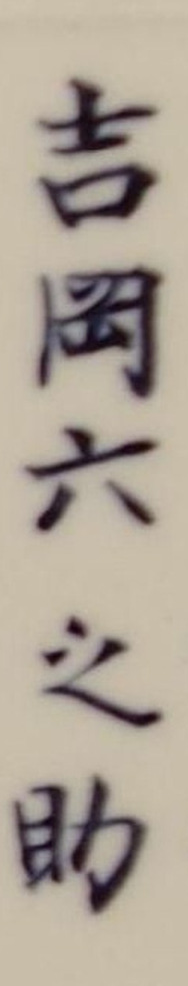吉岡六之助
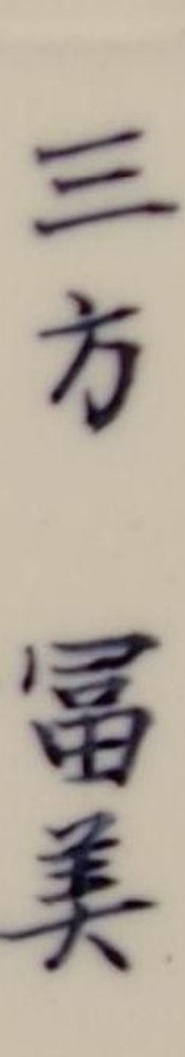三方冨美
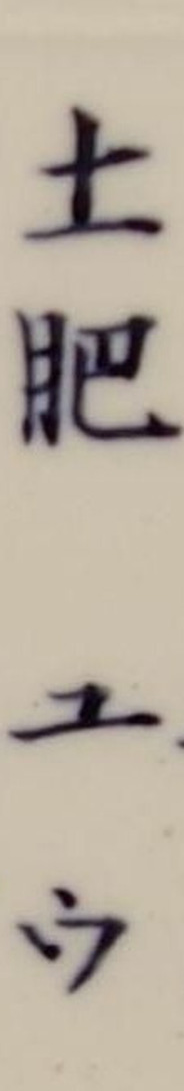土肥ユウ
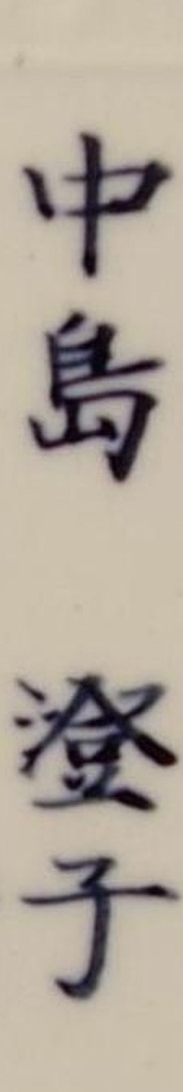中島澄子
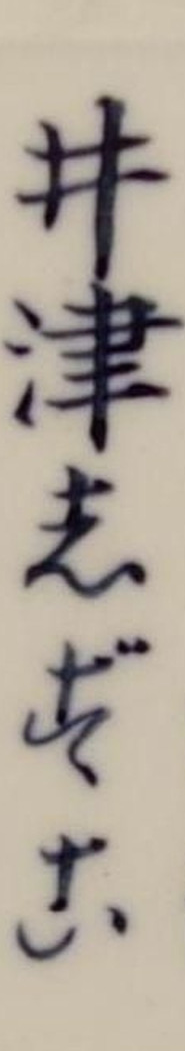井津しずこ
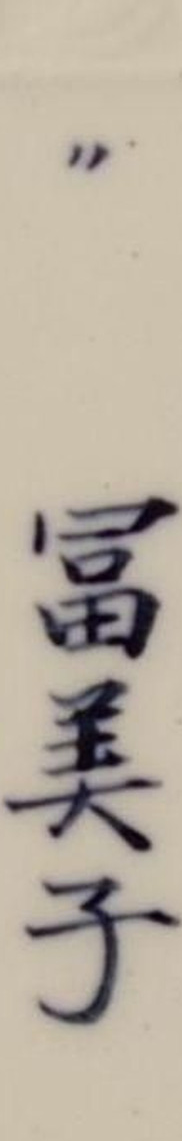冨美子
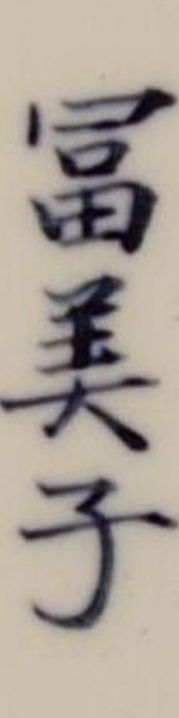冨美子
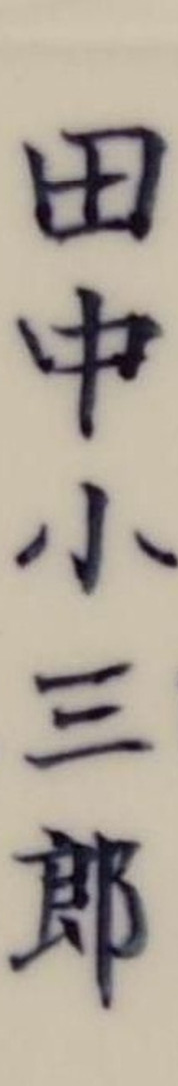田中小三郎
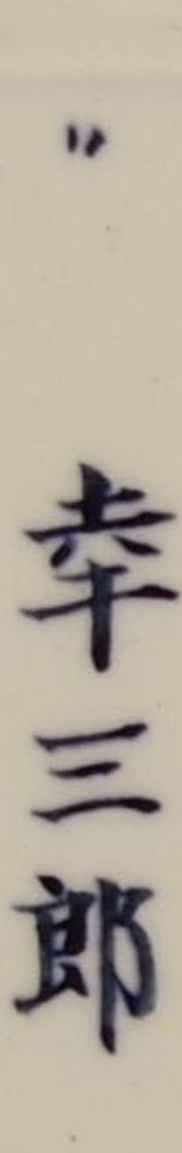幸三郎
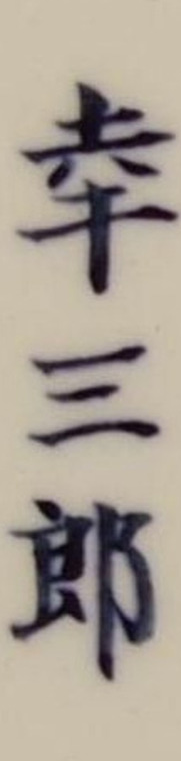幸三郎
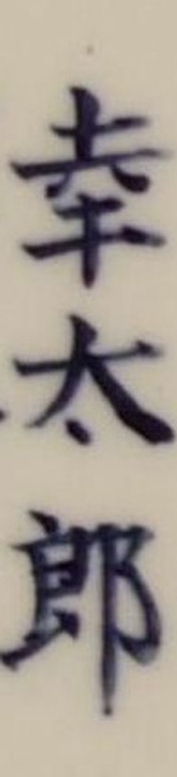幸太郎
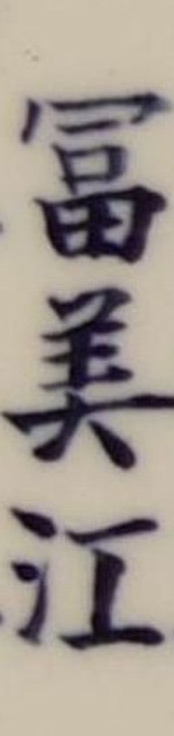冨美江
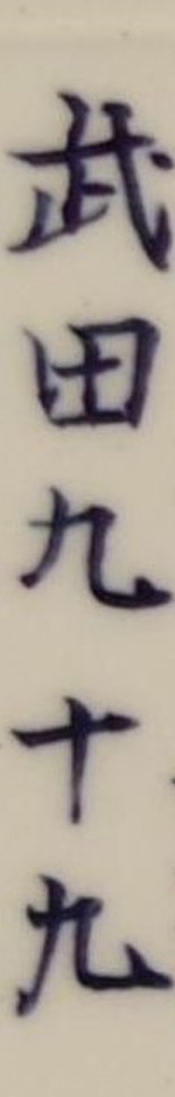武田九十九
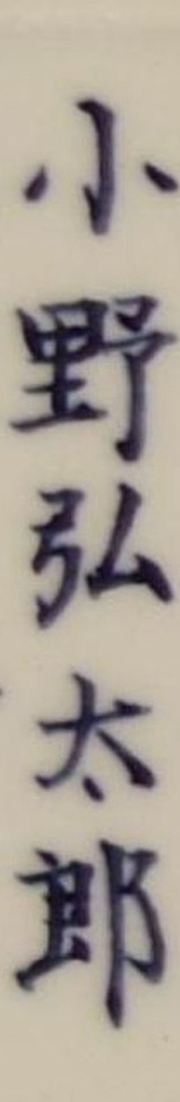小野弘太郎
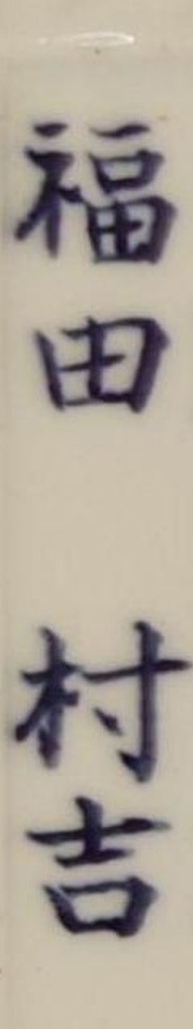福田村吉

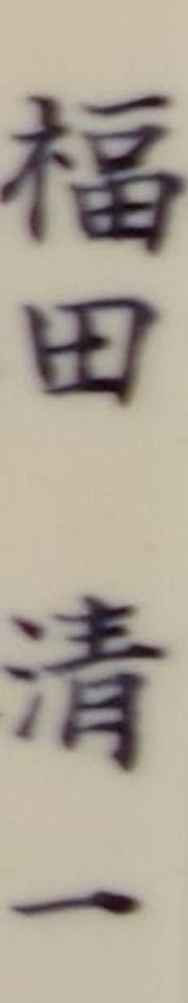福田清一
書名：M~S
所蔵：高野山金剛峯寺
